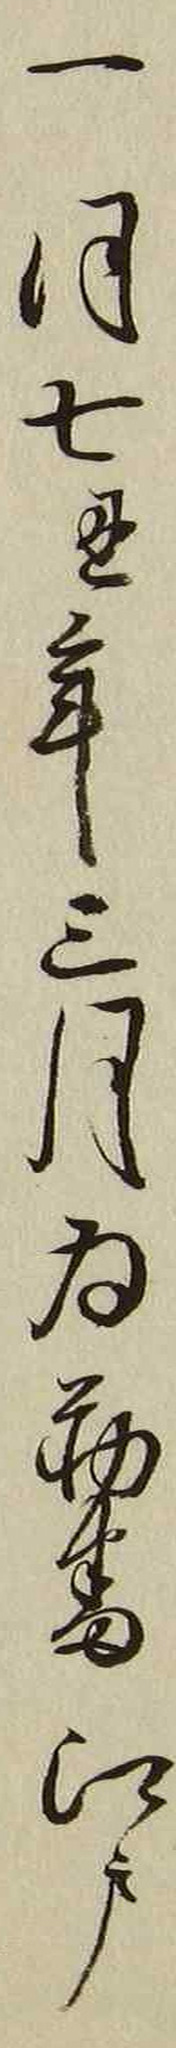一同七丑年三月為勤番江戸
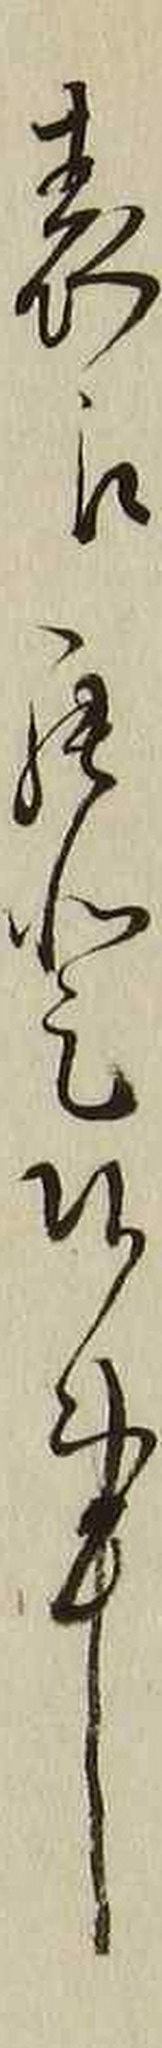表江罷登候事
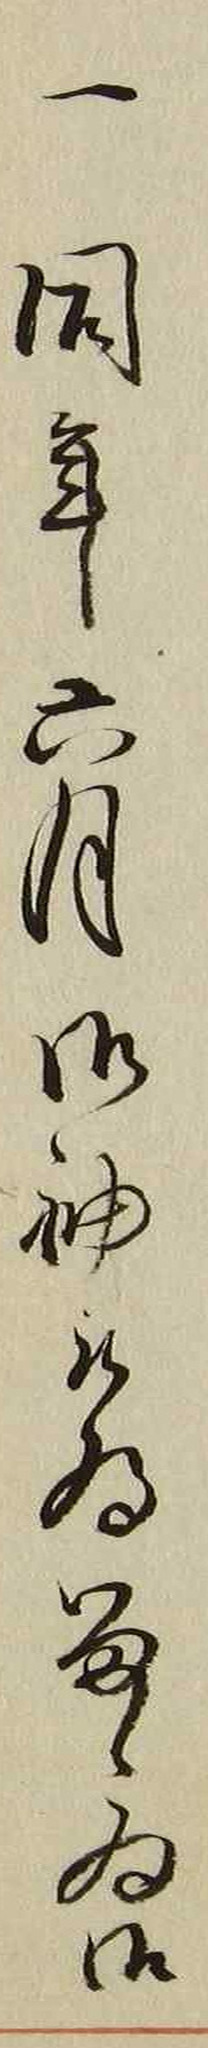一同年六月御袖被為留候為御
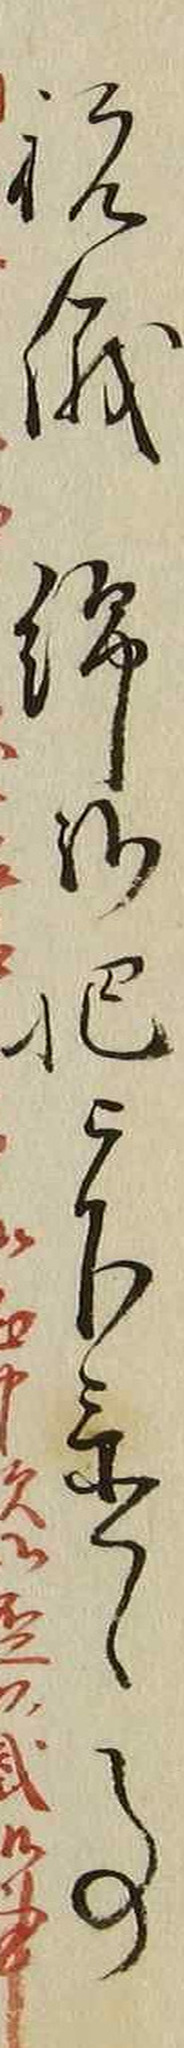祝儀綿弐肥被下置候事
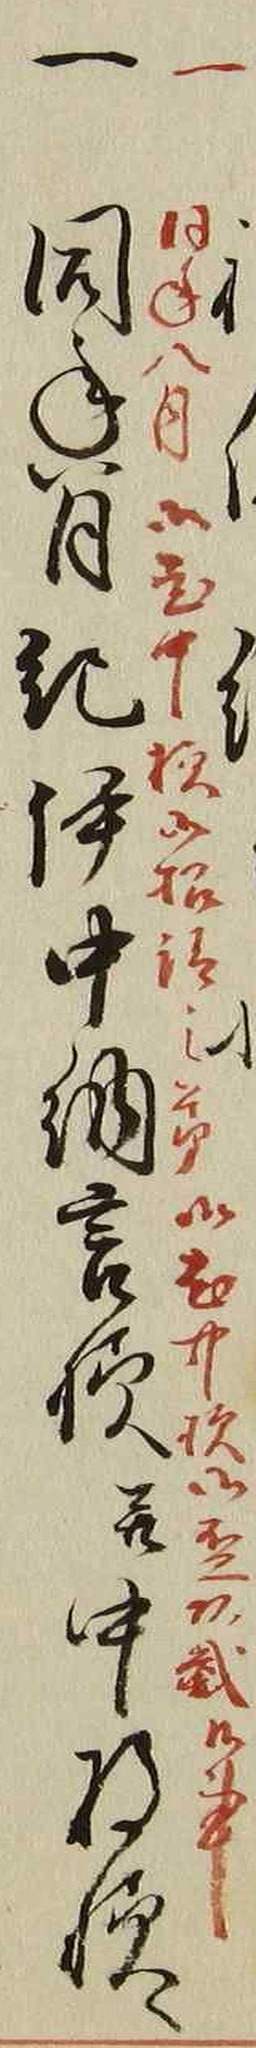一同年八月紀伊中納言様并中将様へ
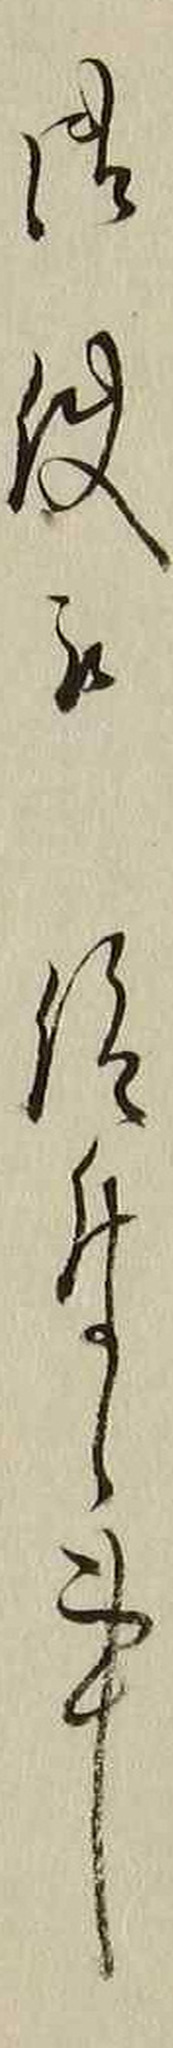御使被仰付候事
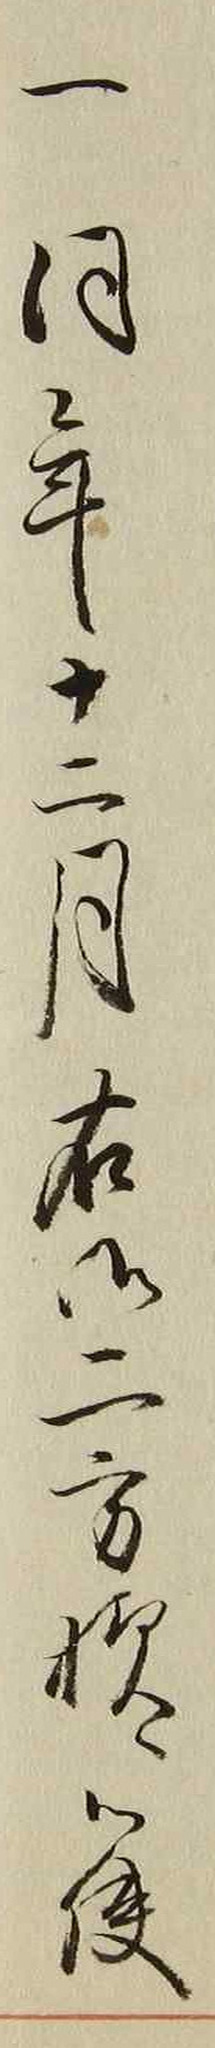一同年十二月右御二方様へ御使
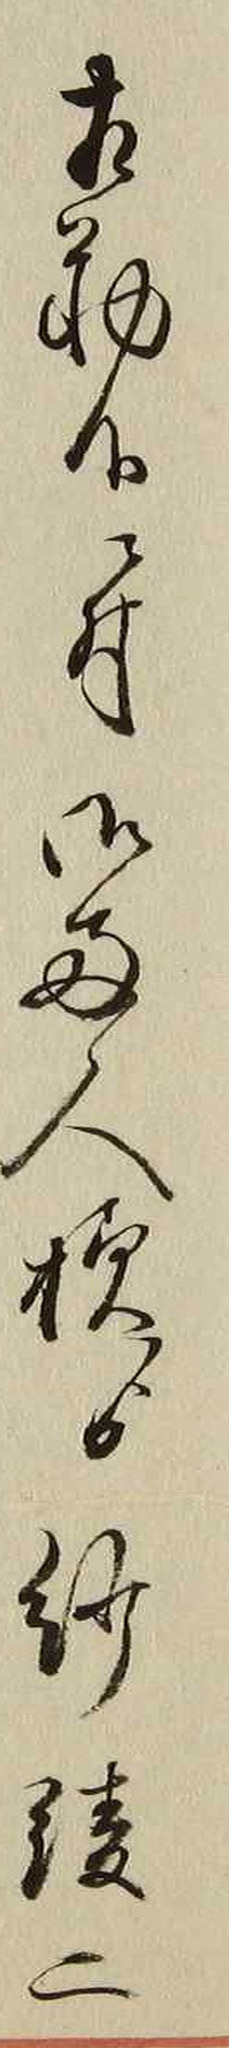相勤候ニ付御両人様ゟ紗綾二
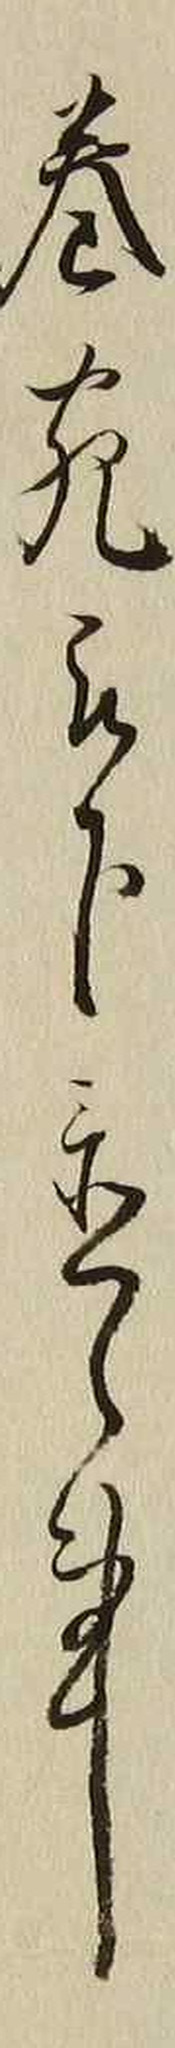巻宛被下置候事
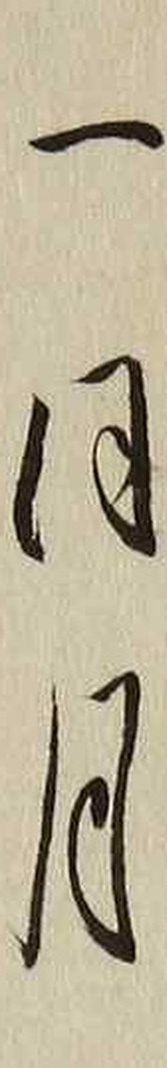一同月
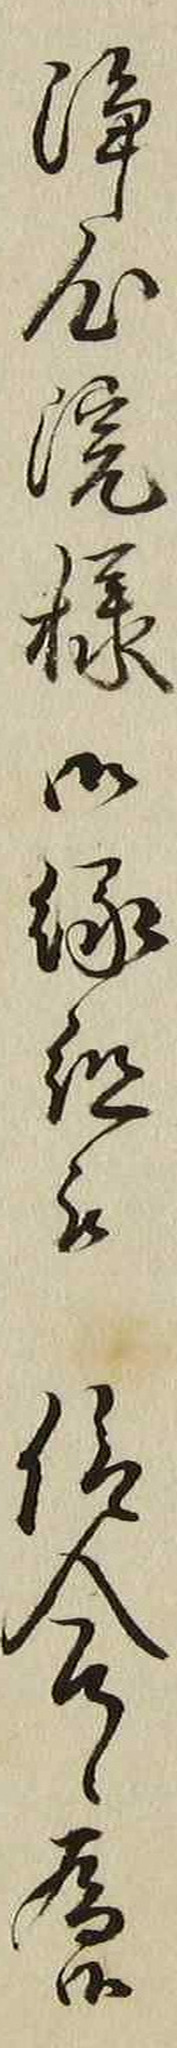浄心院様御縁組被仰合候為御
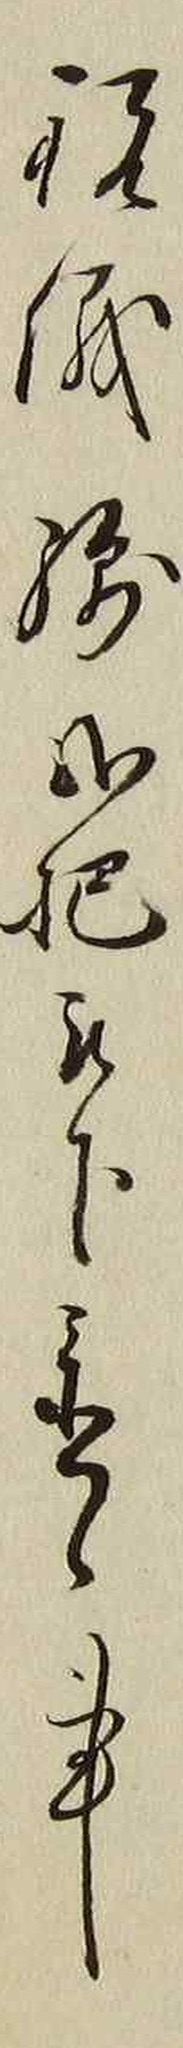祝儀綿弐肥被下置候事
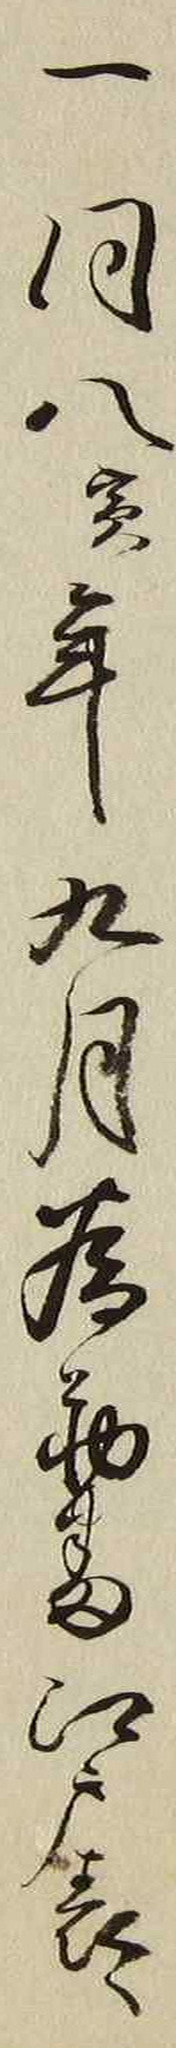一同八寅年九月為勤番江戸表へ
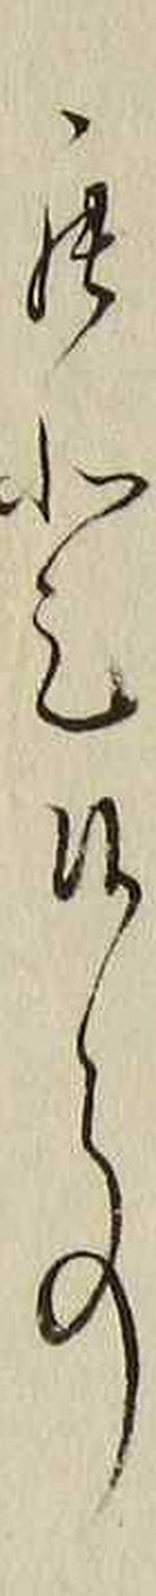罷登候事
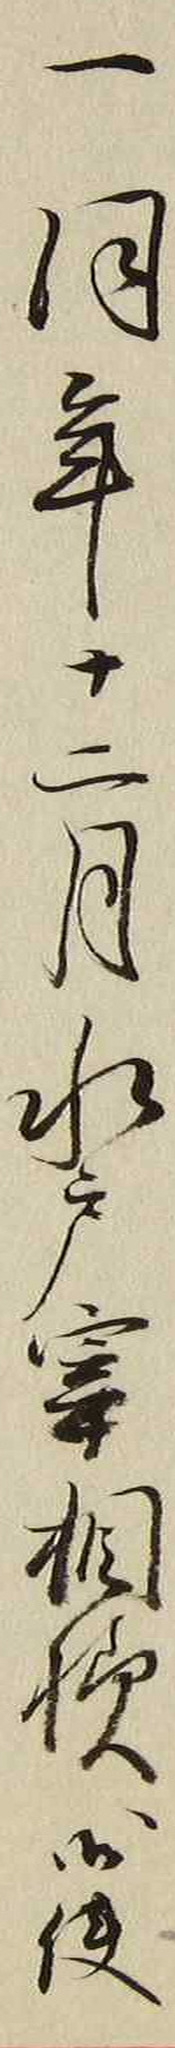一同年十二月水戸宰相様へ御使
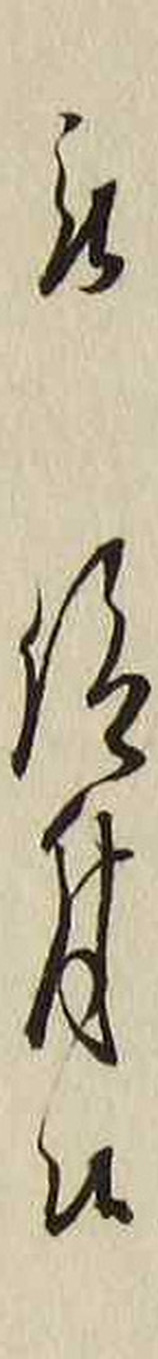被仰付候
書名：諸士系譜　巻之1　い之部1
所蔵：会津若松市立会津図書館
